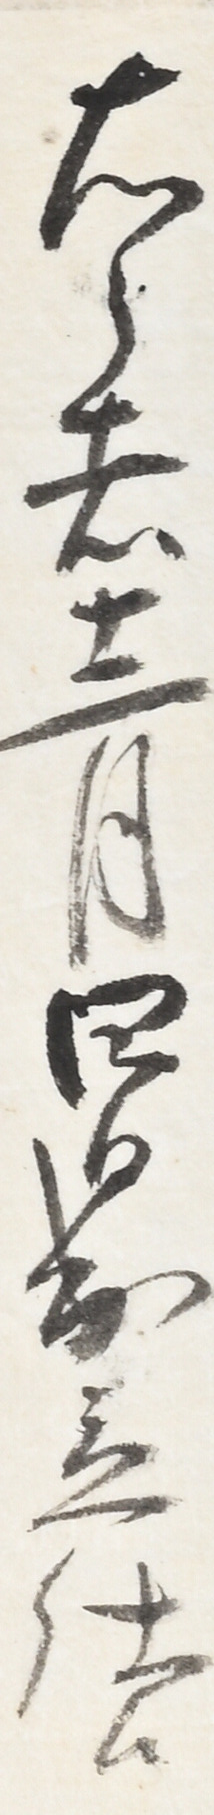右之者十二月四日出立仕候
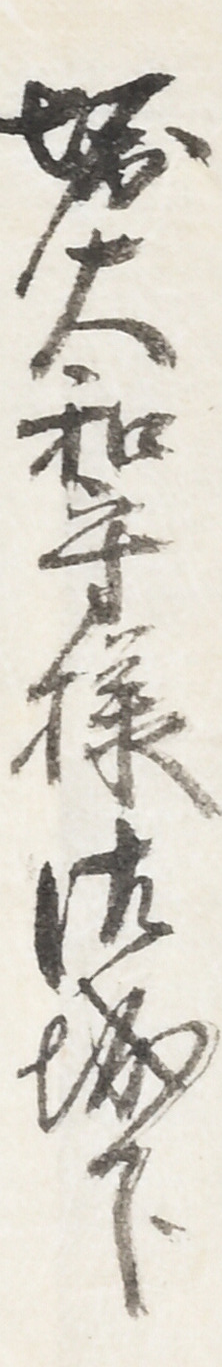堀大和守様御城下
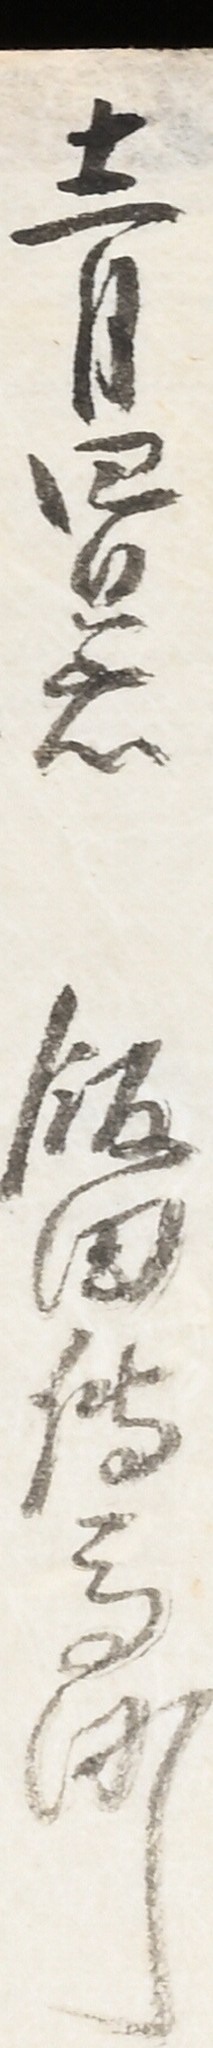十二月四日着飯田伝馬町
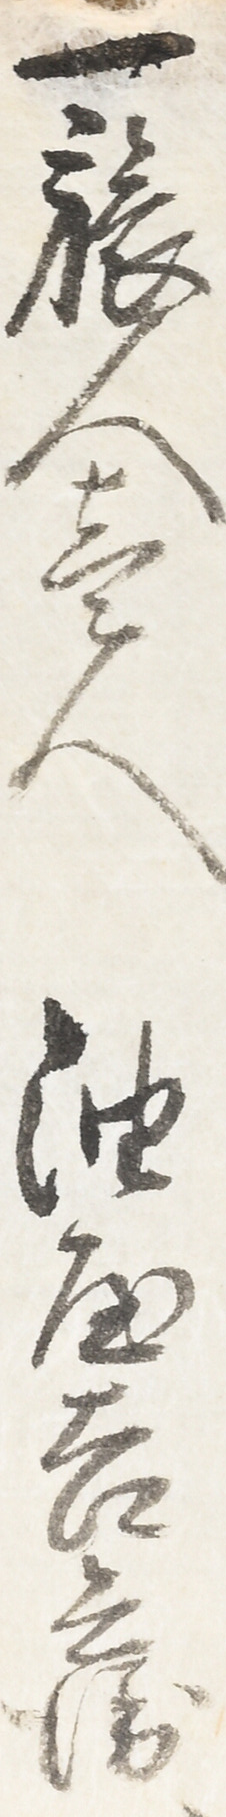一旅人壱人油屋吉兵衛・
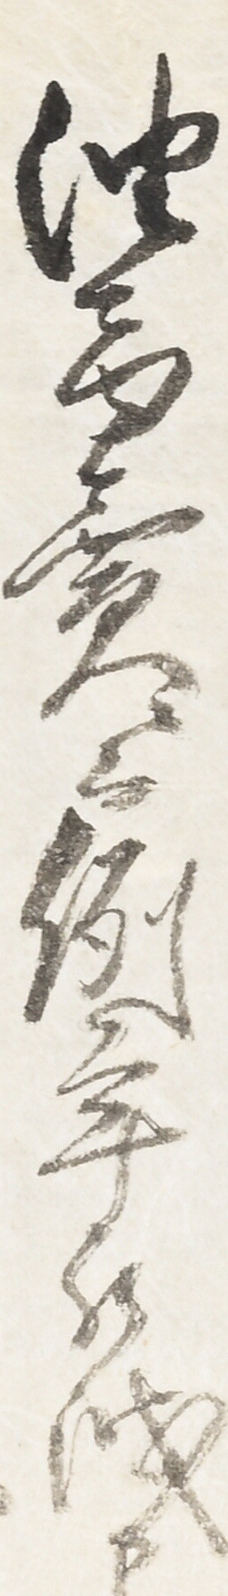油商売ニ而例年罷越申候
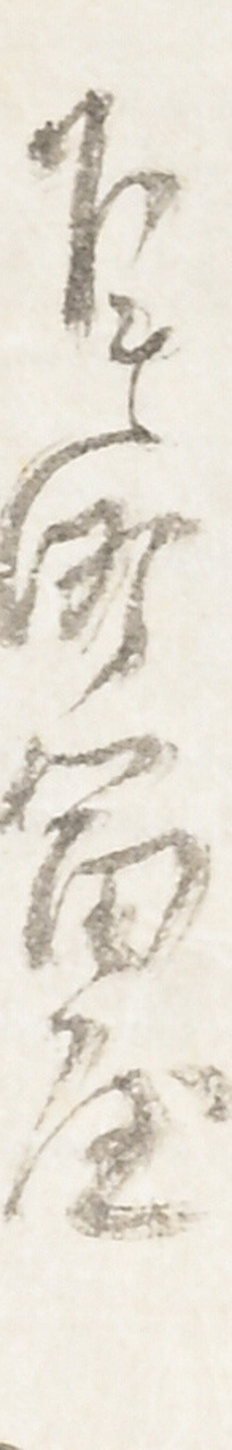下モ町冨屋
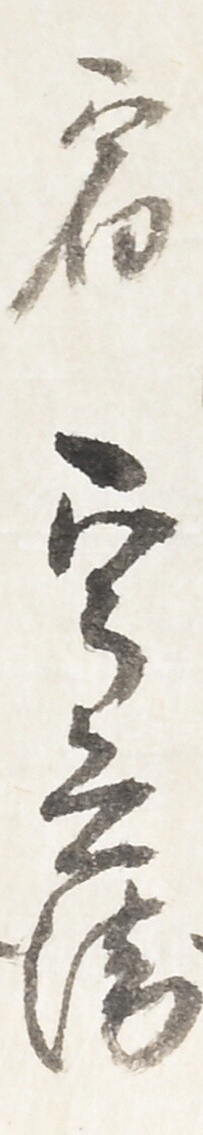宿宇兵衛
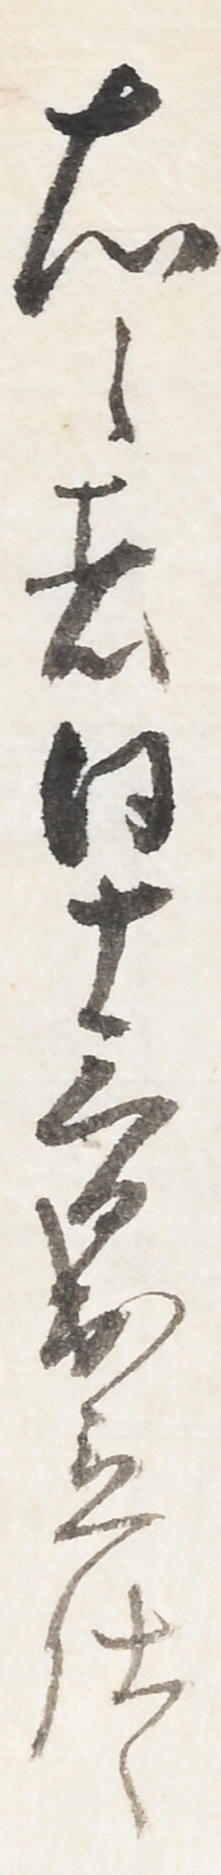右之者同十三日出立仕候
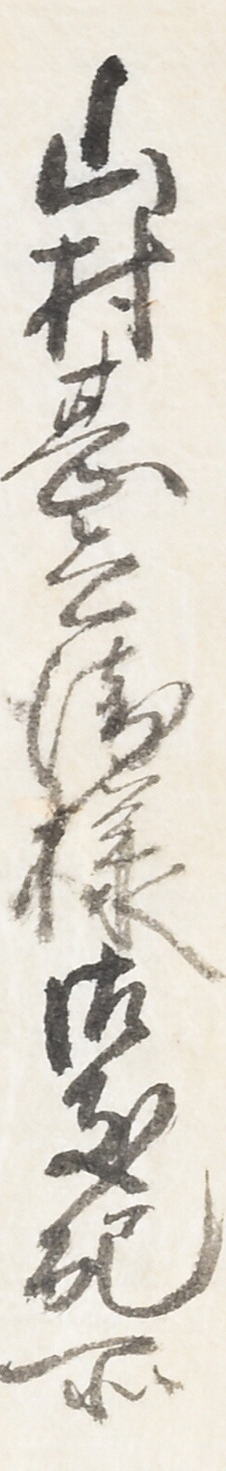山村甚兵衛様御支配所
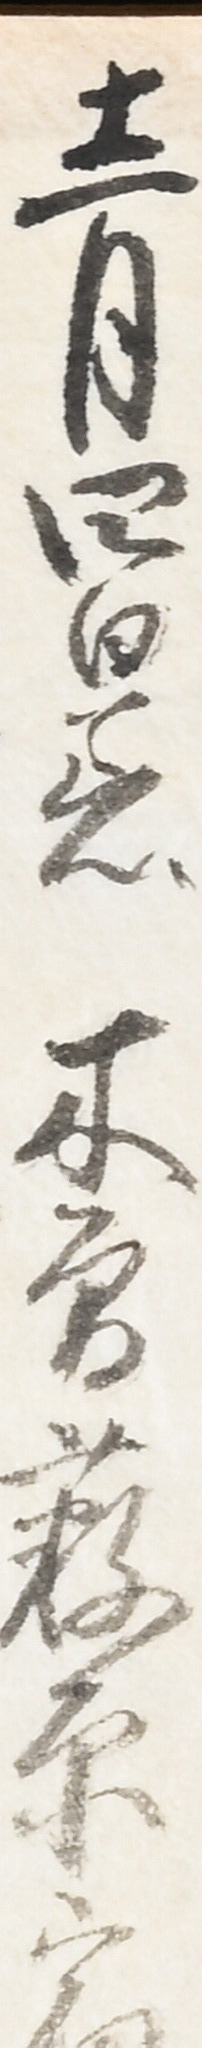十二月四日着木曾藪原宿
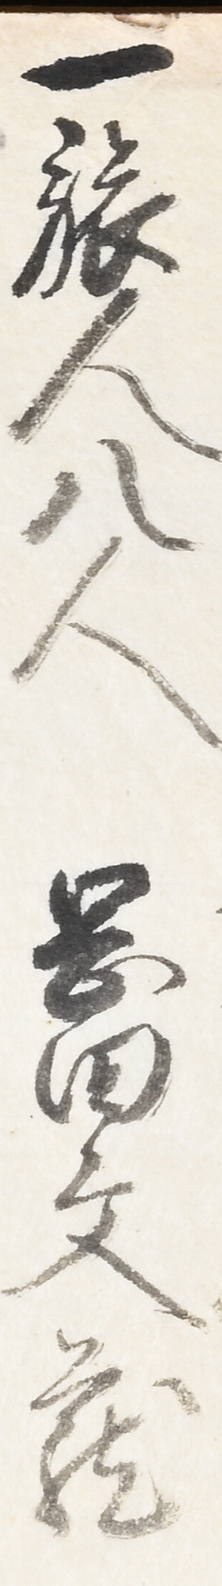一旅人八人岡田文蔵・
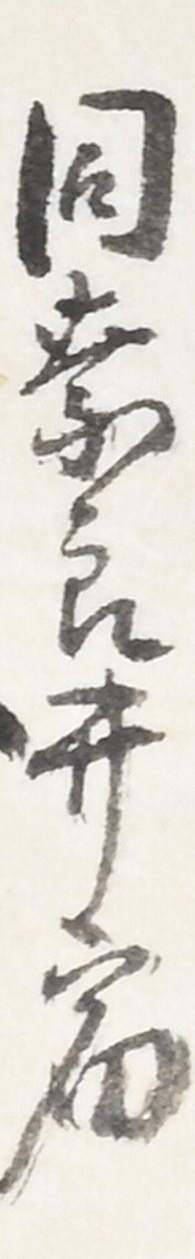同奈良井宿
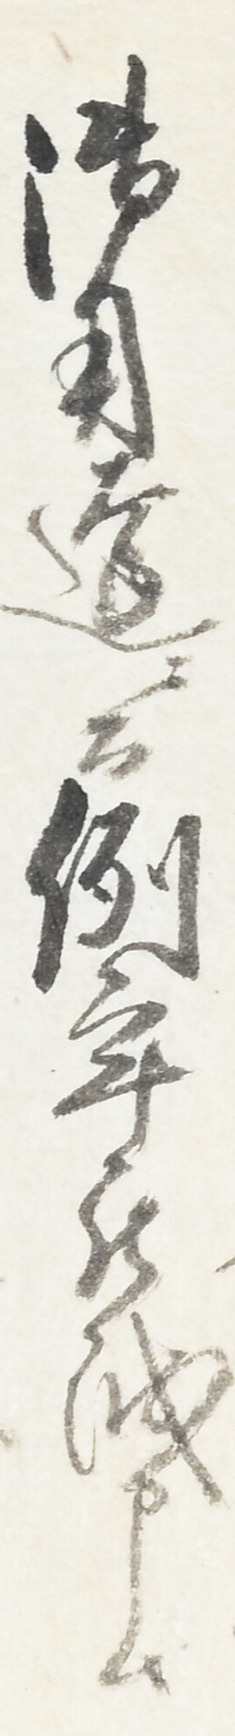御用達ニ而例年罷越申候
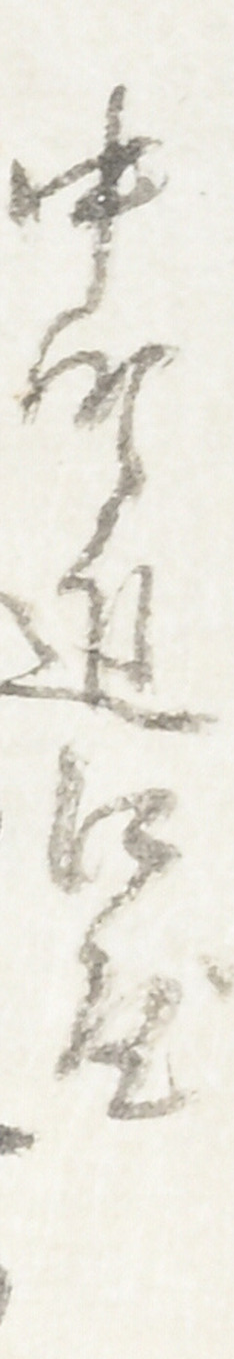中町近江屋
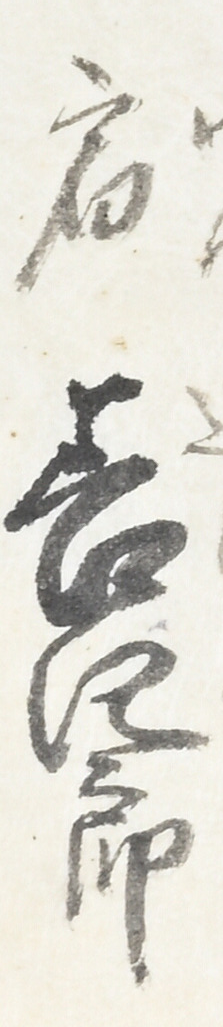宿善四郎
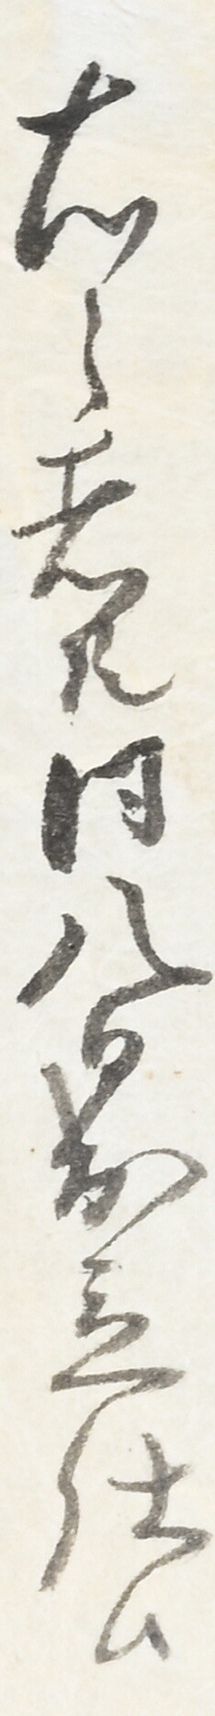右之者共同八日出立仕候
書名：旅人泊控帳
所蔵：伊那市立高遠町図書館・合同会社AMANE
